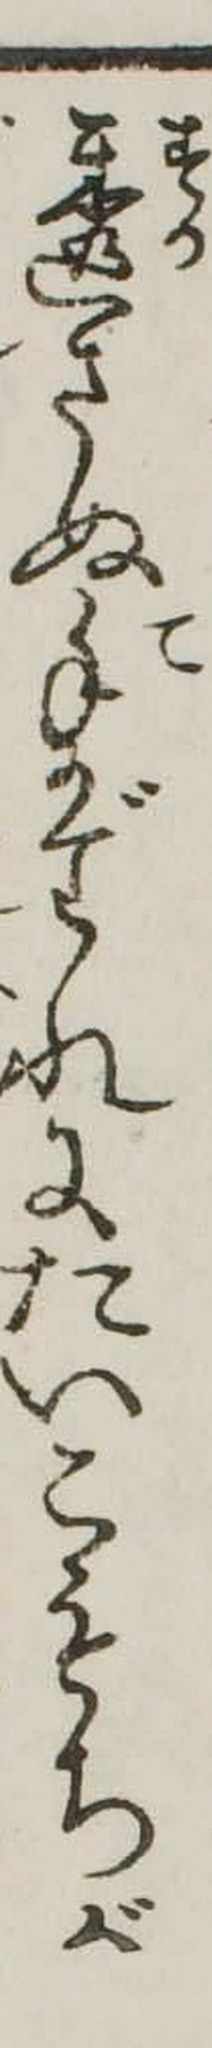透さぬ手だれにたいこもちが
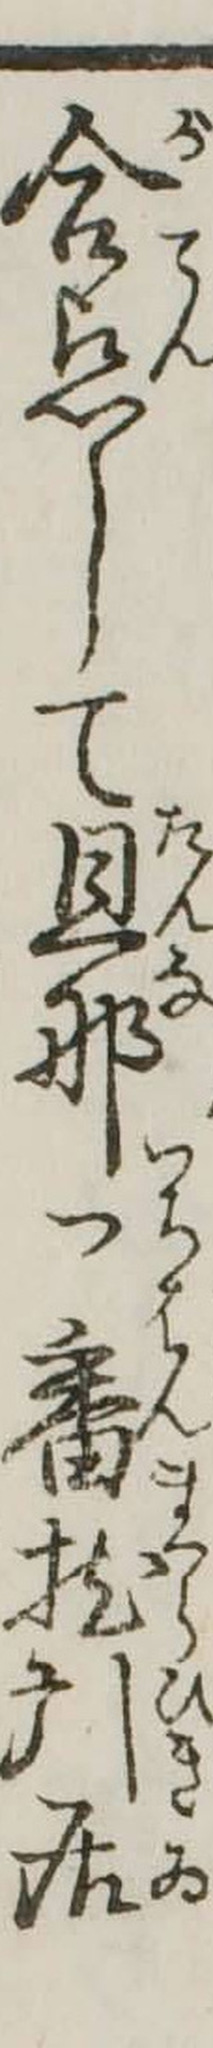合点して旦那一番枕引居
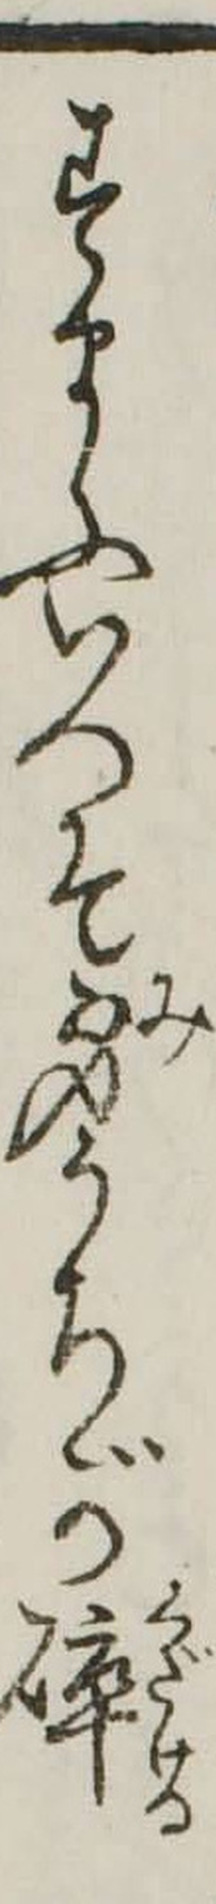すまふいつそ身うちが砕
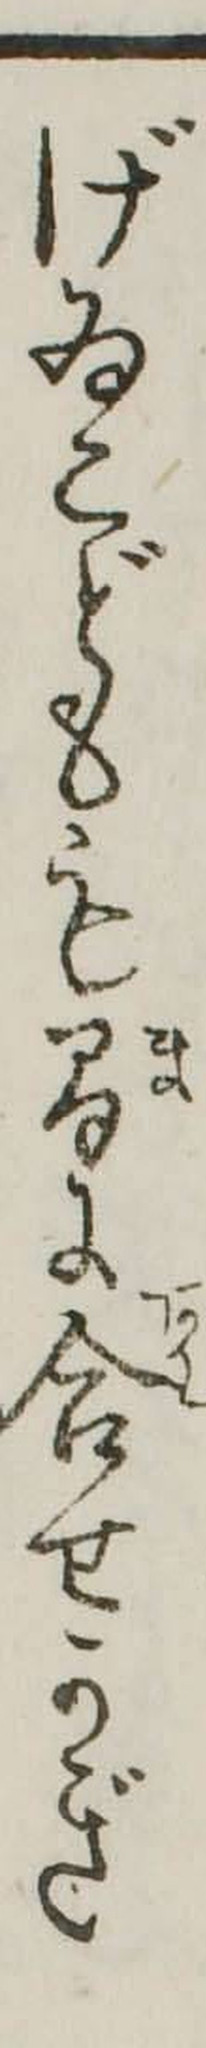げゐこどもも間に合せかぎ
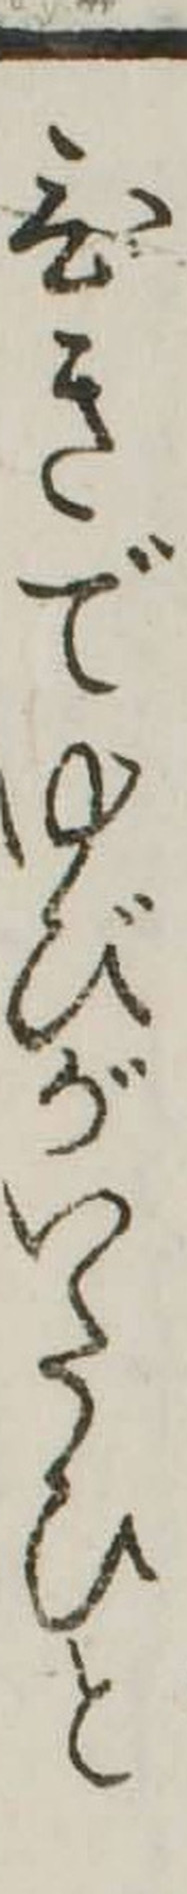ひきでゆびがいたひと
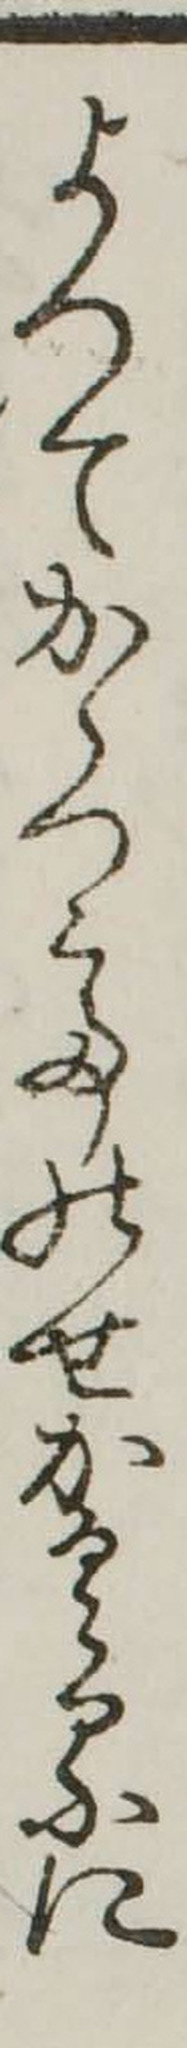よつてかゝつてのせかくるに
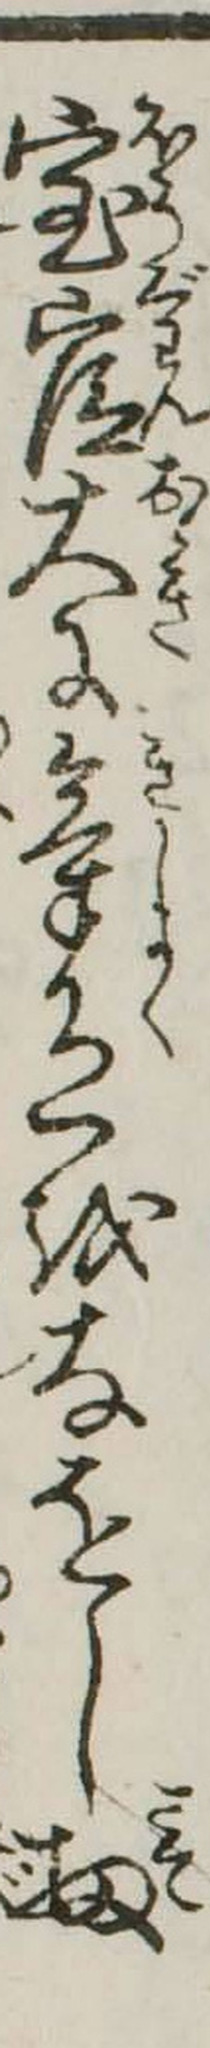宝岩大に気色をなをし扨
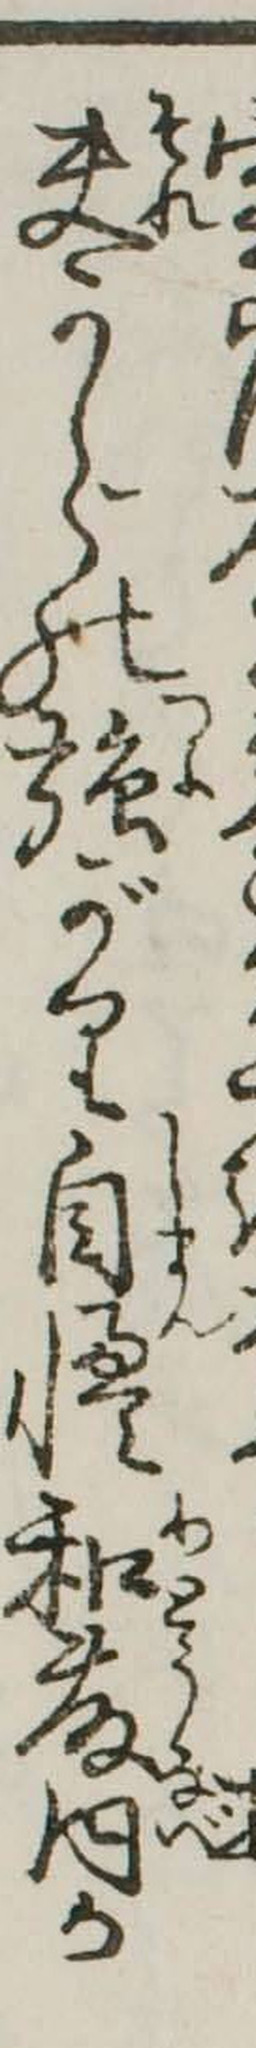夫からの強がり自慢和藤内か
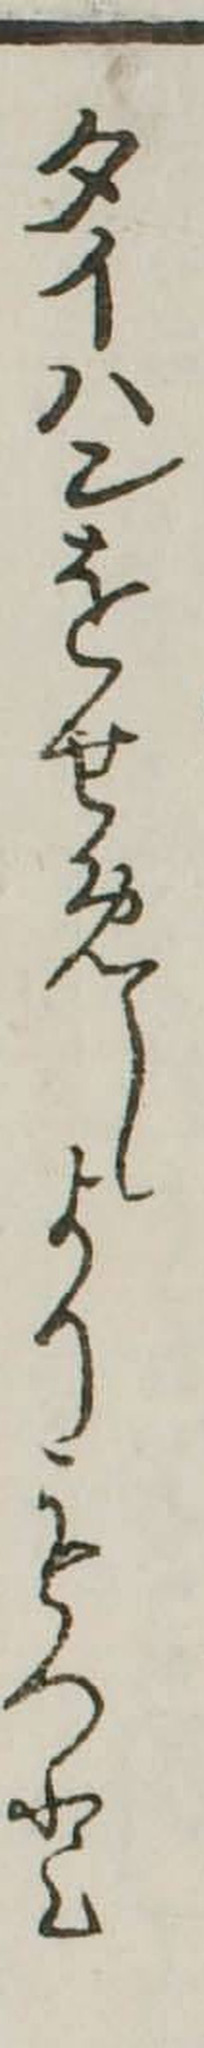タイハンをせめしよりもつと
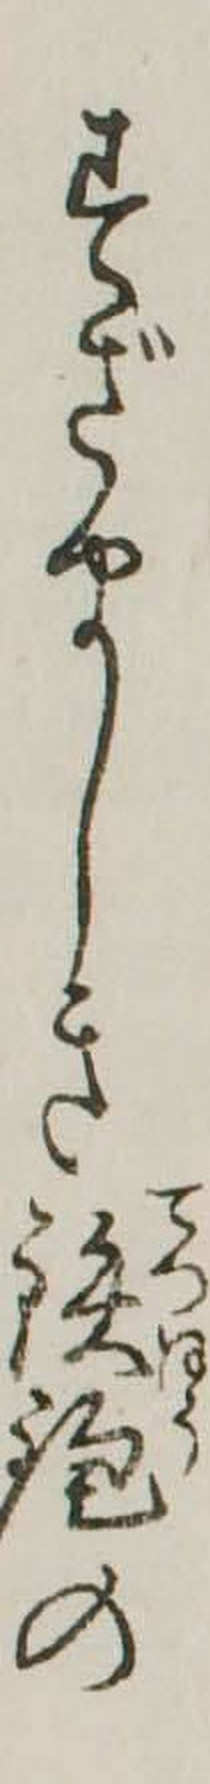すざましき鉄炮の
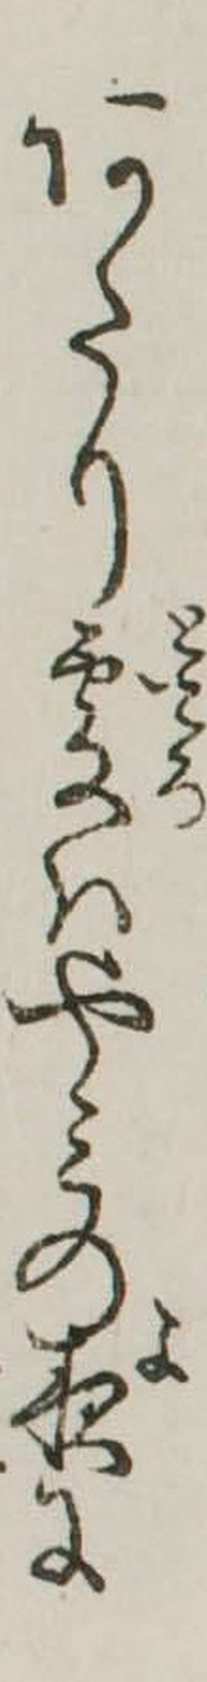あたり処はやみの夜に
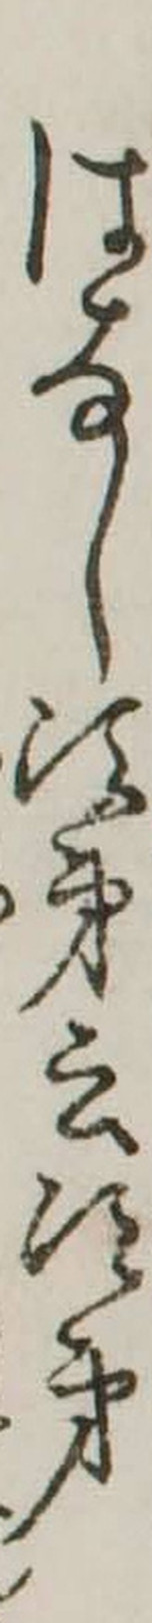はなし次第云次第

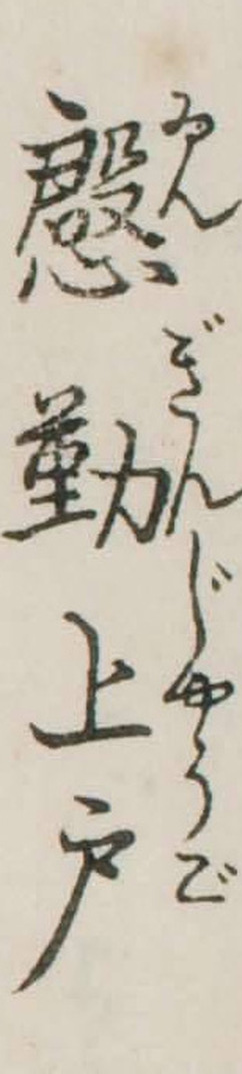慇勤上戸
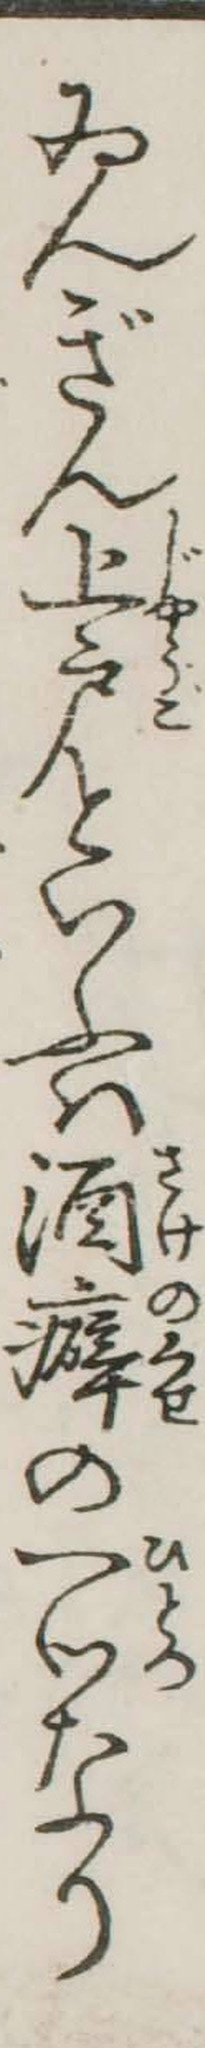ゐんぎん上戸といふは酒癖の一ツなり
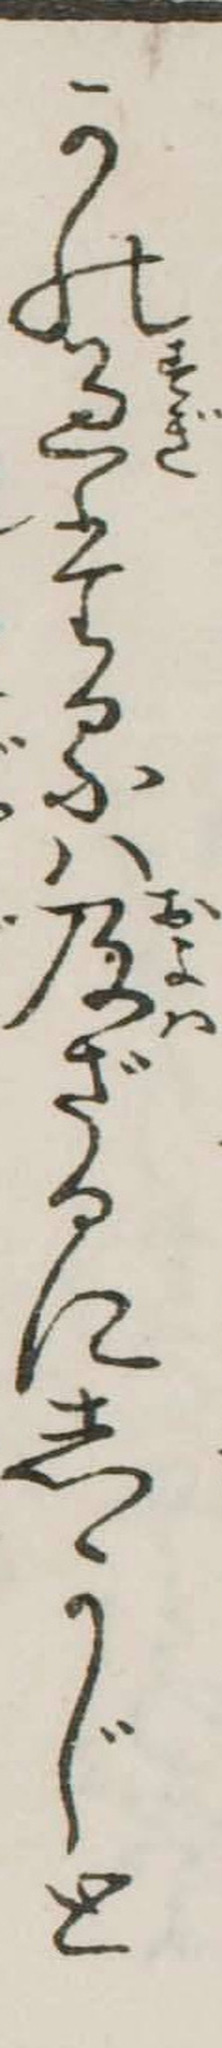かの過たるは及ざるにしかじと
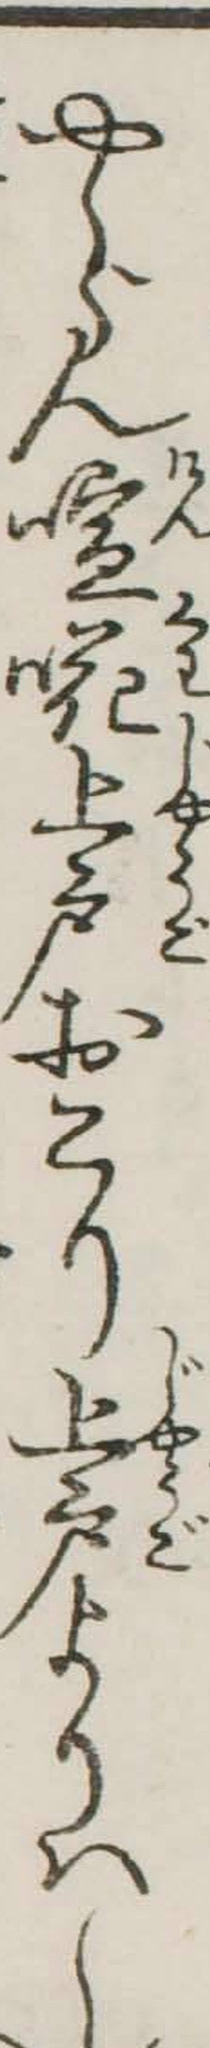やらん喧嘩上戸おこり上戸よりは
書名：繪本不盡泉
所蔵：国文学研究資料館
